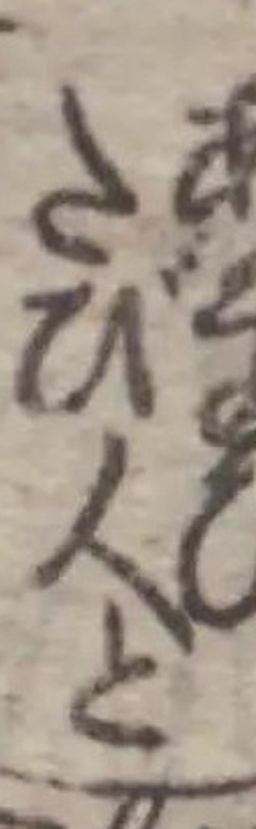たび人と
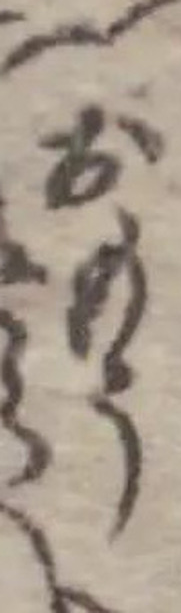おもう
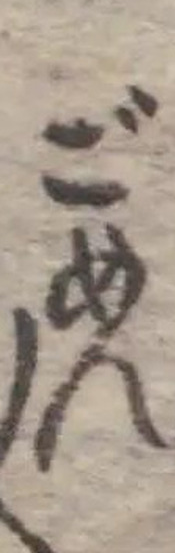ごめん
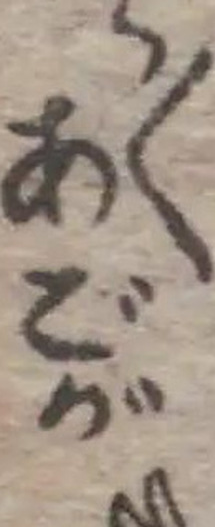あてが
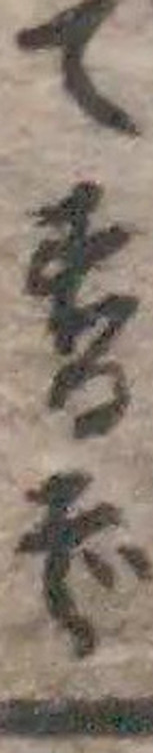するぞ

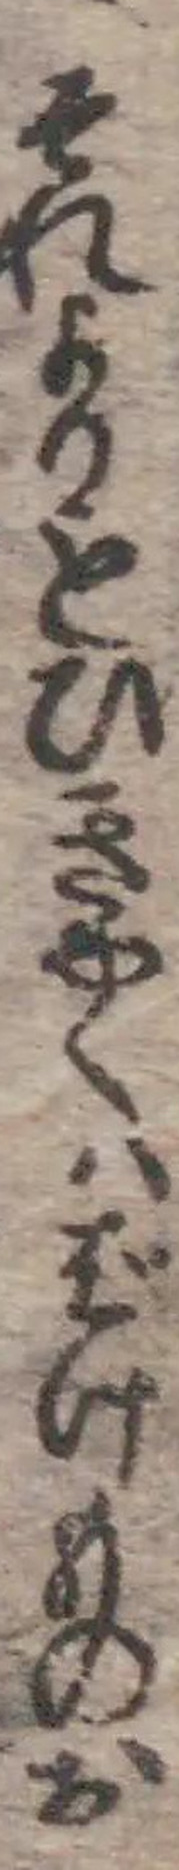それよりもひきやくはばけものお
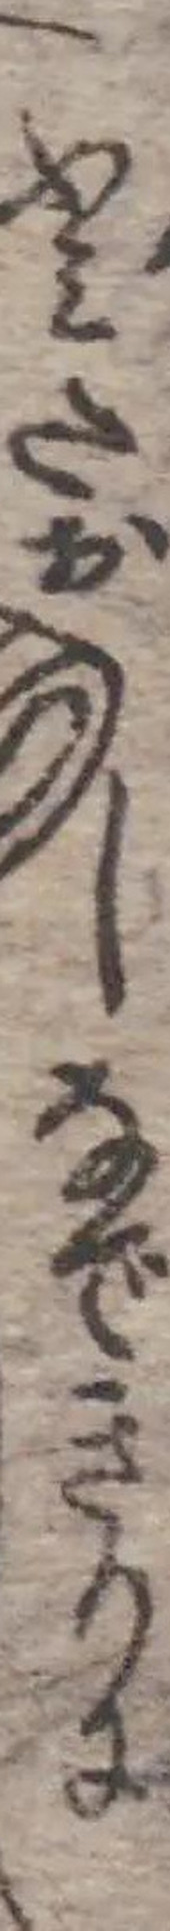ふみたおしなできりに
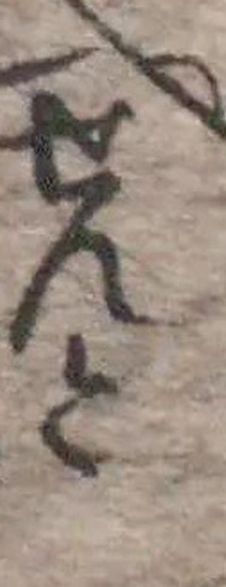せんと
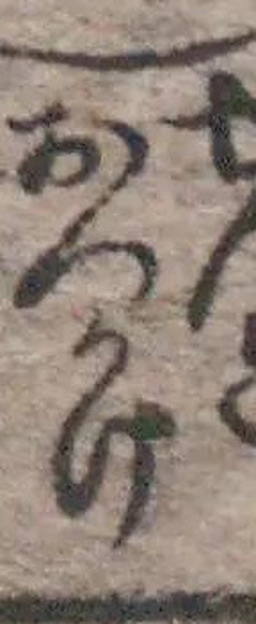おつかけ
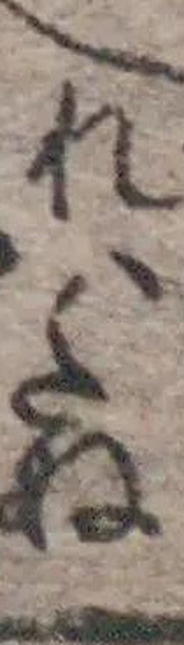れはたぬ
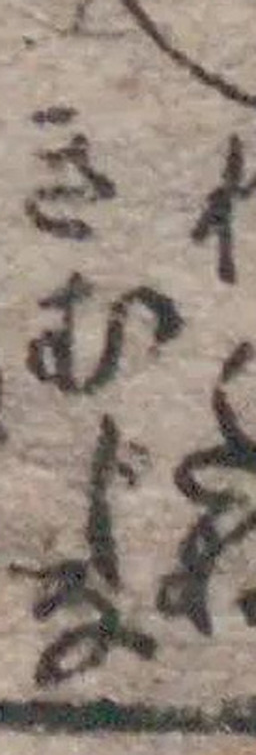きむじな
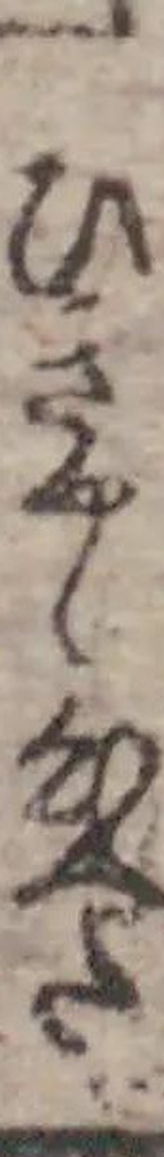ひきやくなん？た
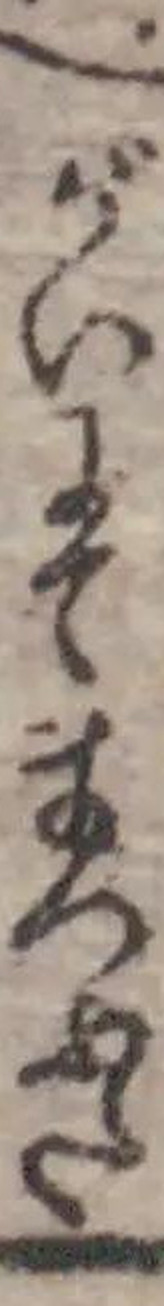がいにてまつふた
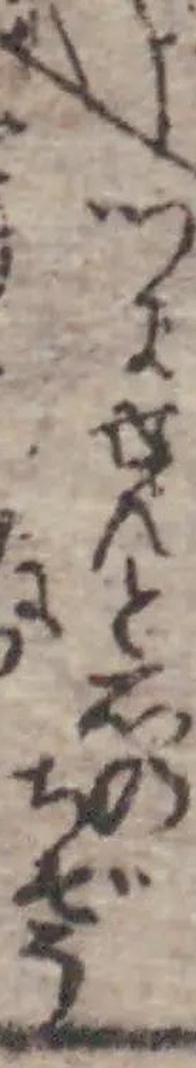つにせんと石のちぞう
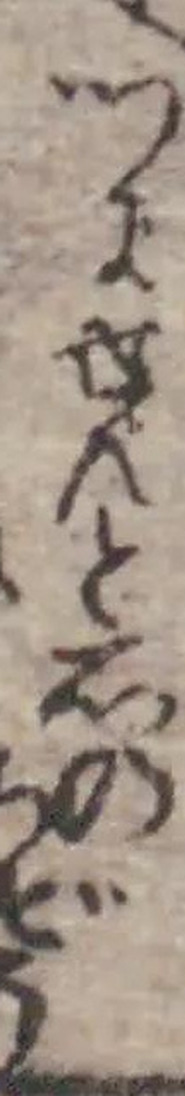つにせんと石のちぞう
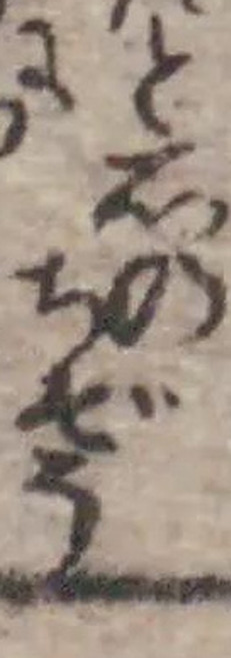ぢぞう
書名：大磯地蔵咄 2巻
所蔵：国立国会図書館 National Diet Library, JAPAN
